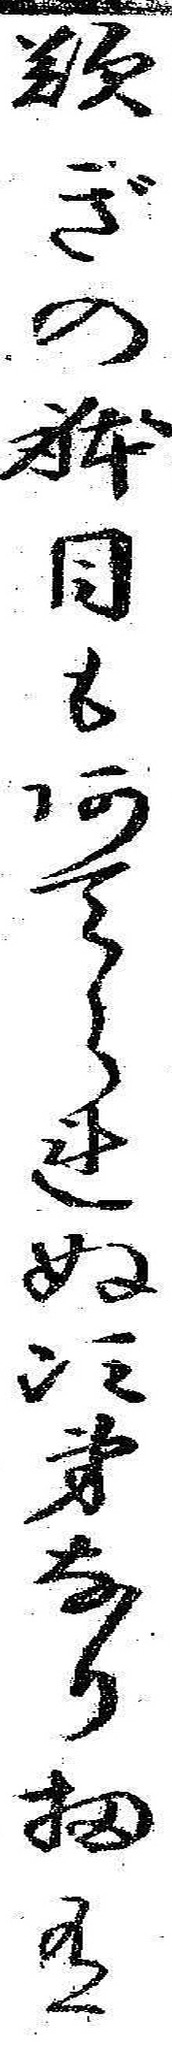歎ぎの体目もあてられぬ次第なり扨有
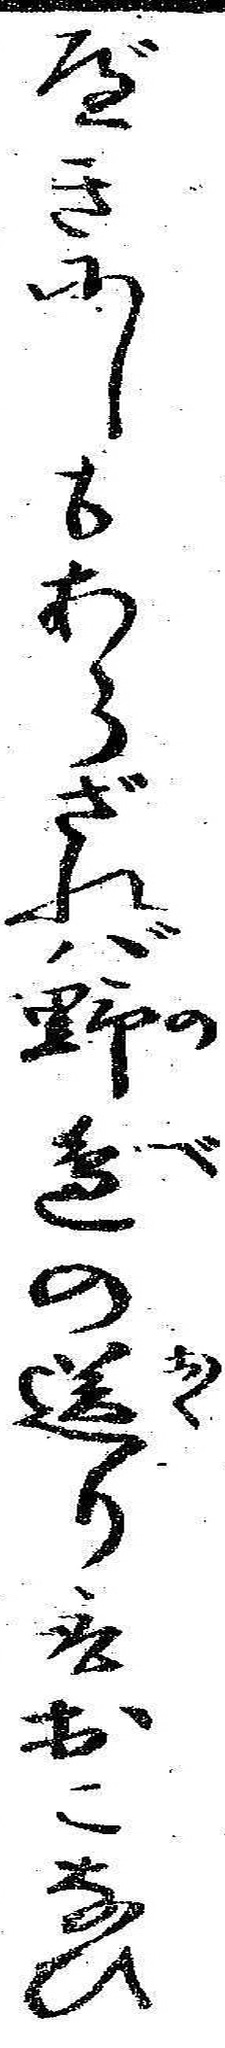べきにしもあらざれば野辺の送り取おこなひ
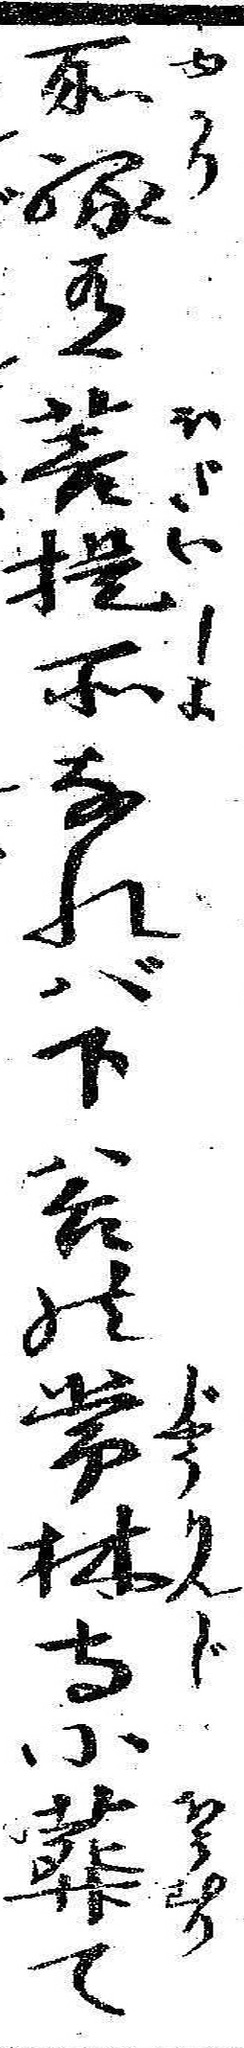所縁有菩提所なれば下谷の常林寺に葬て
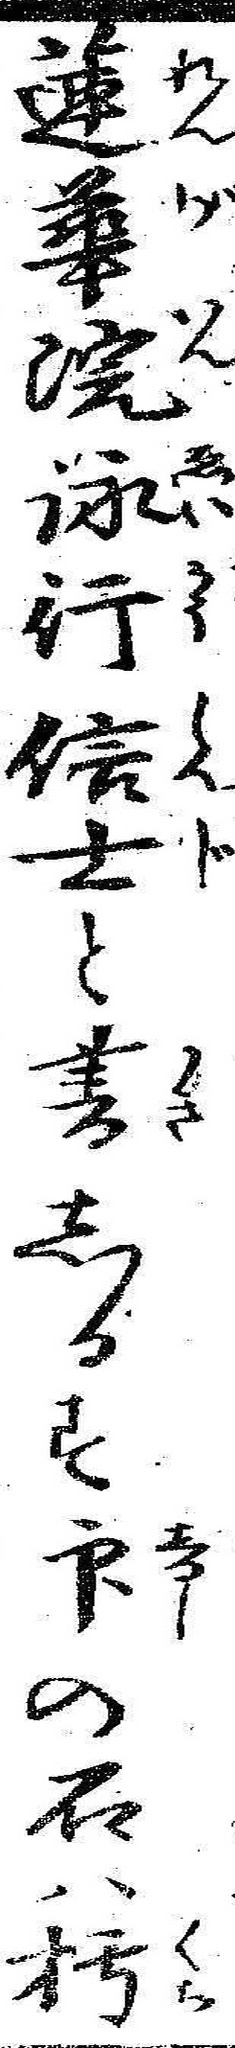蓮華院詠行信士と書しるす印の石は朽
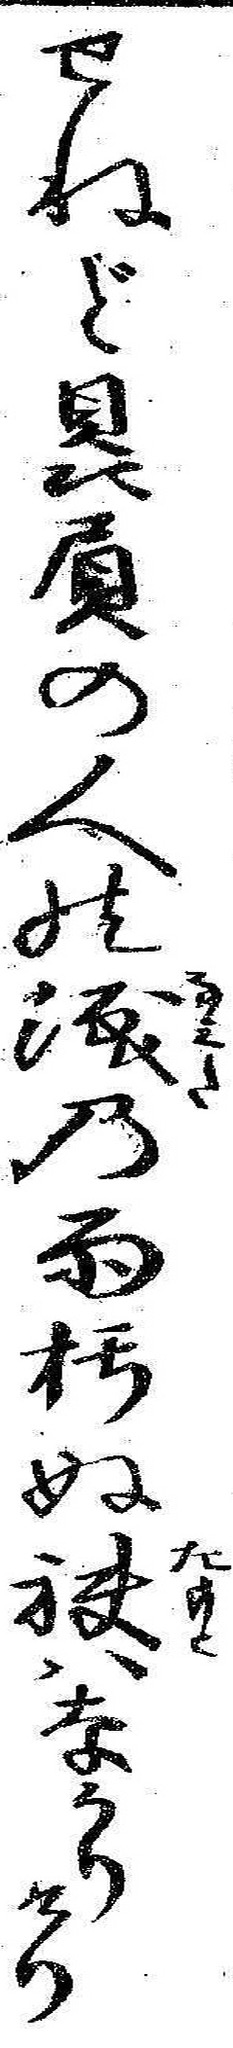せねど贔屓の人の涙の雨朽ぬ袂はなかり

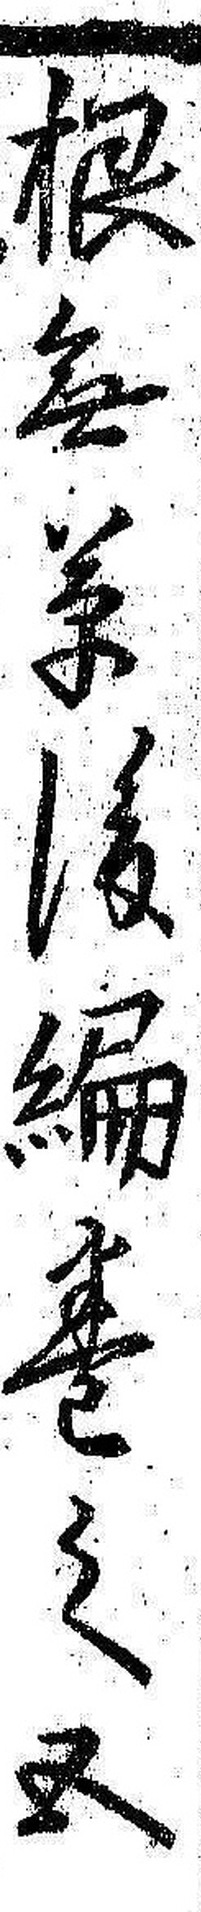根無草後編巻之五
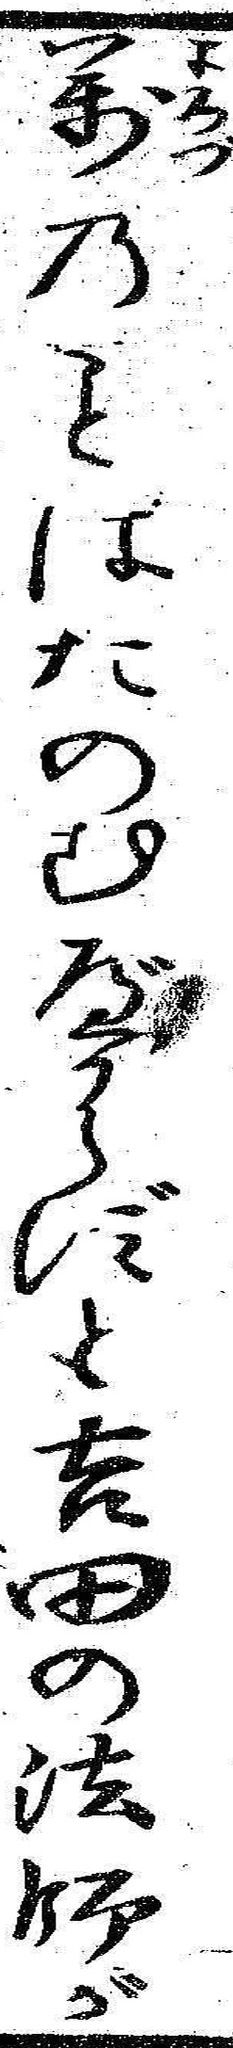万のことはたのむべからずと吉田の法師が
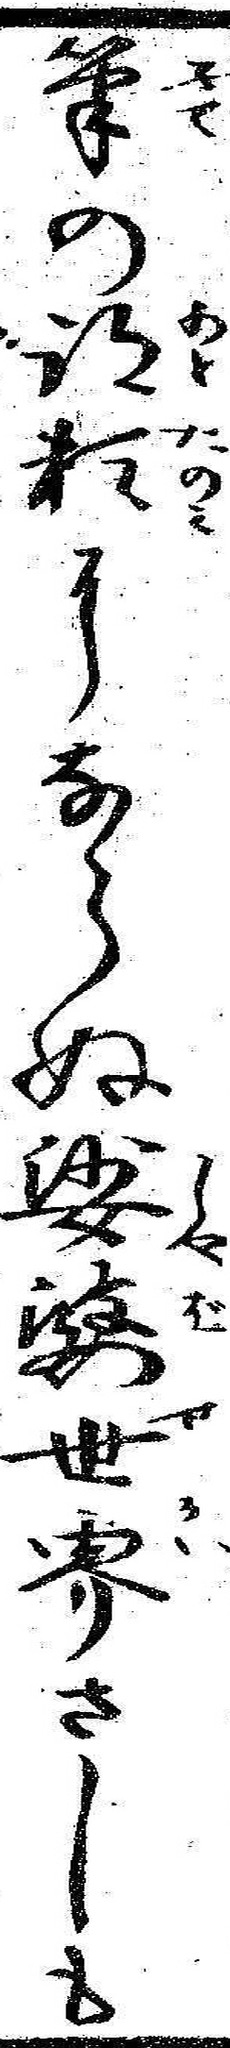筆の跡頼にならぬ娑婆世界さしも
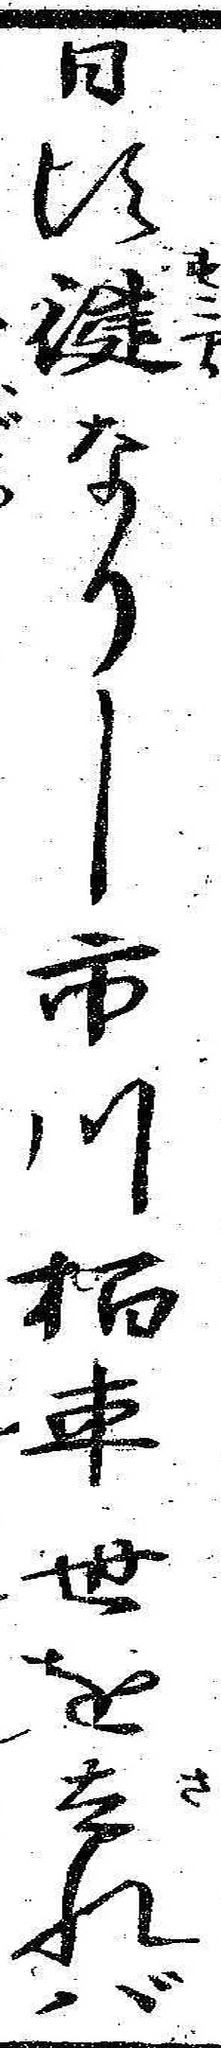日頃健なりし市川栢車世を去れば
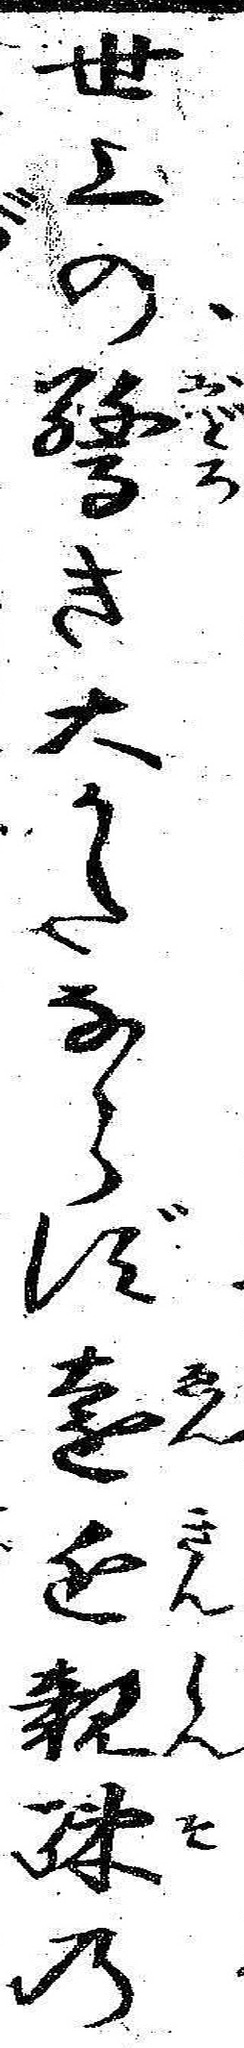世上の驚き大かたならず遠近親疎の
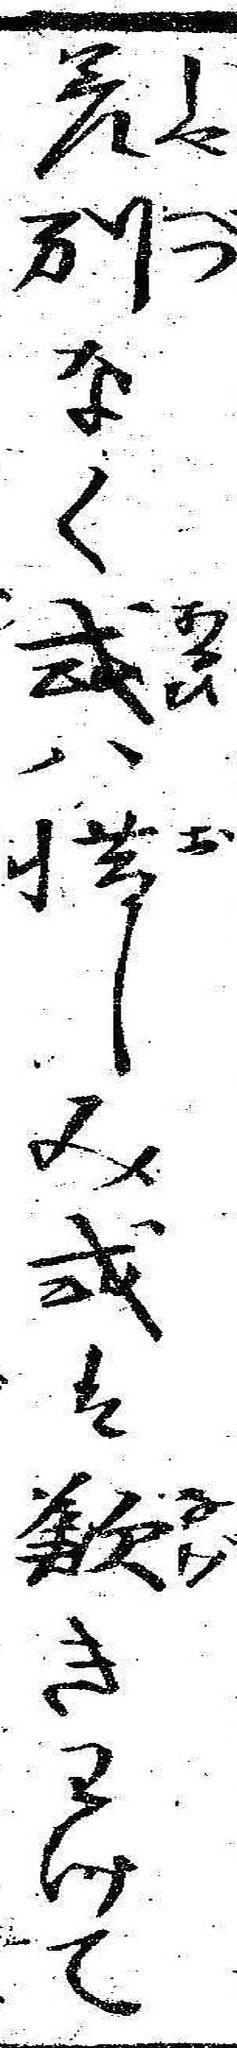差別なく或は惜しみ或は歎きわけて
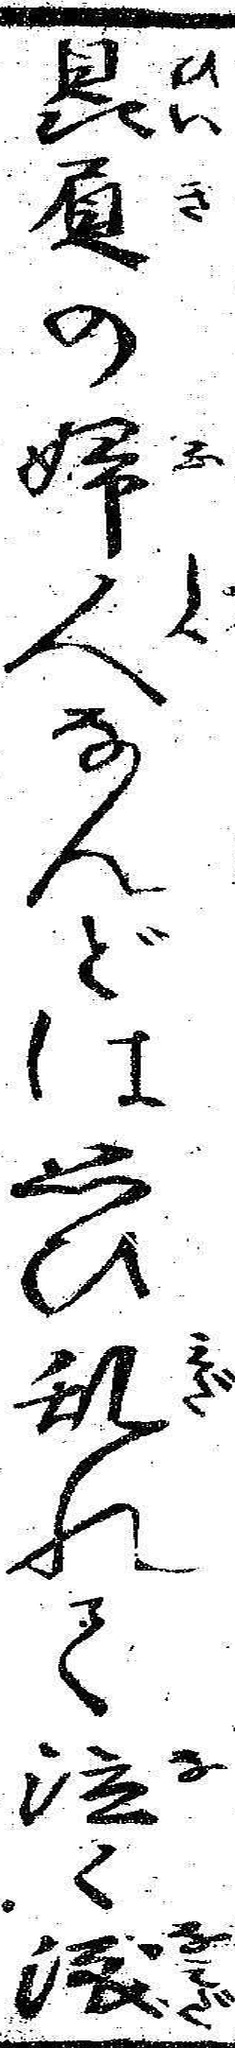贔屓の婦人なんどは思ひ乱れて泣く涙
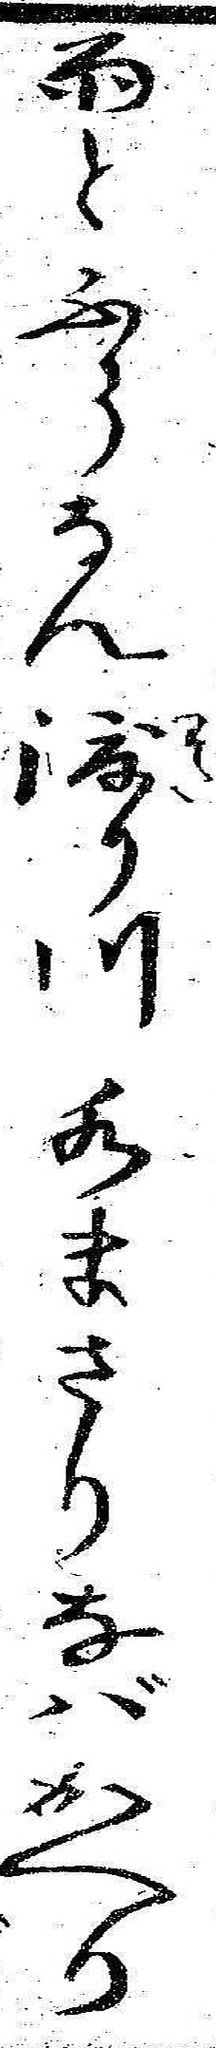雨とふらなん渡川水まさりなばかへり
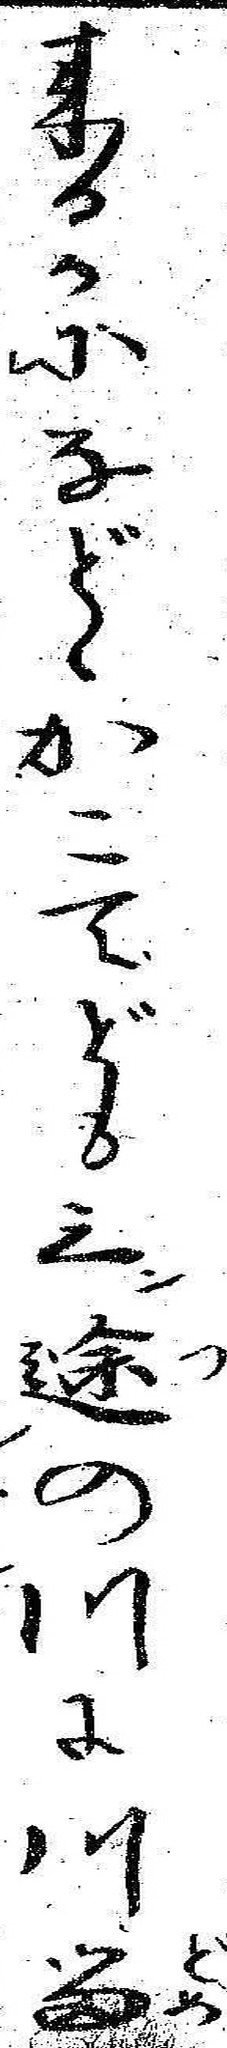来るかになどゝかこてども三途の川に川留
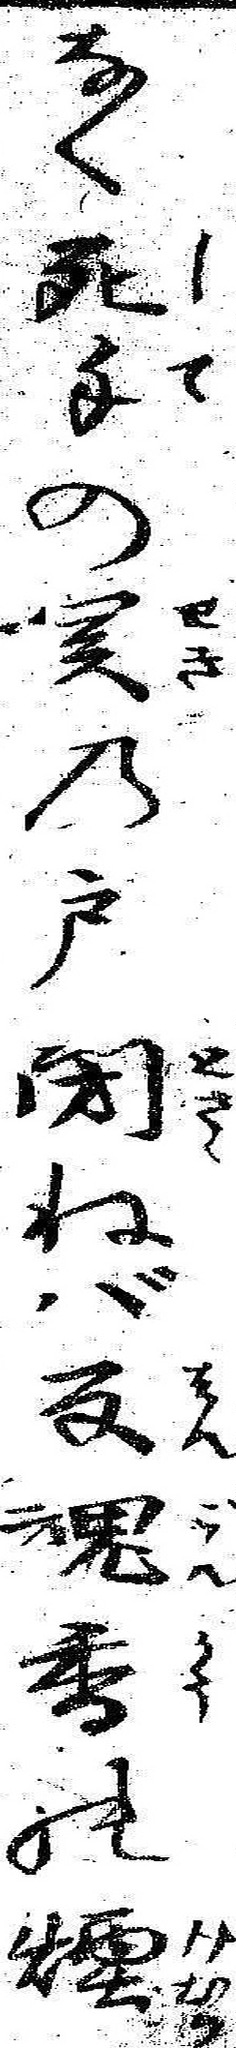なく死手の関の戸閉ねば反魂香の煙

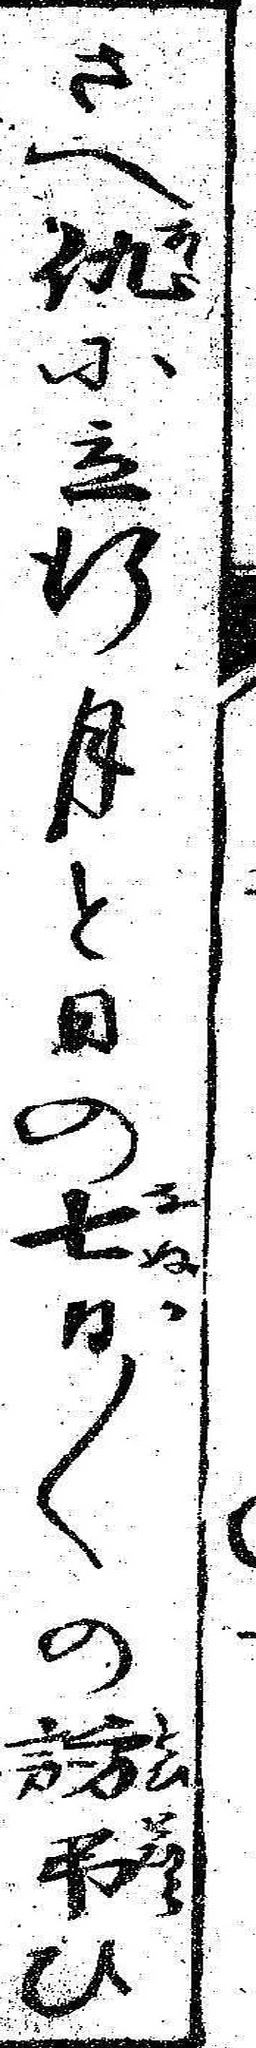さへ仇に立行月と日の七日〱の訪弔ひ
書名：根無草後編
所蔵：国文学研究資料館
